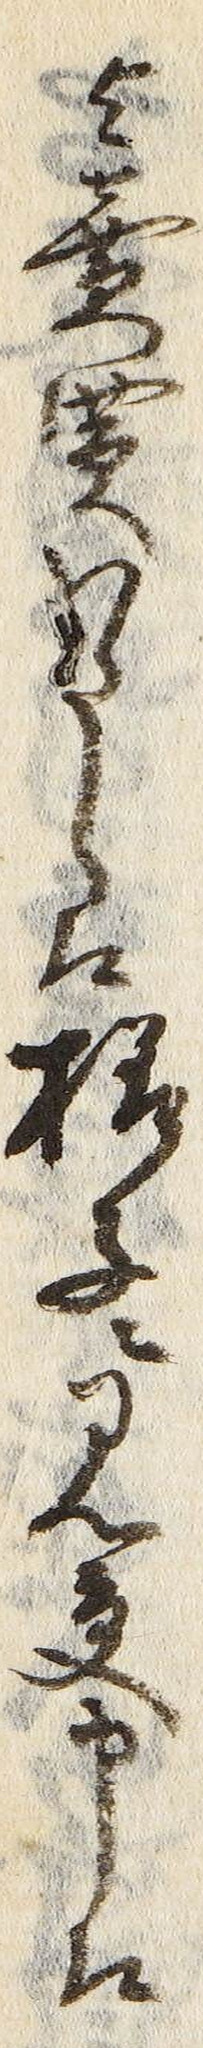と賣買いたし候様子ニ見受申候
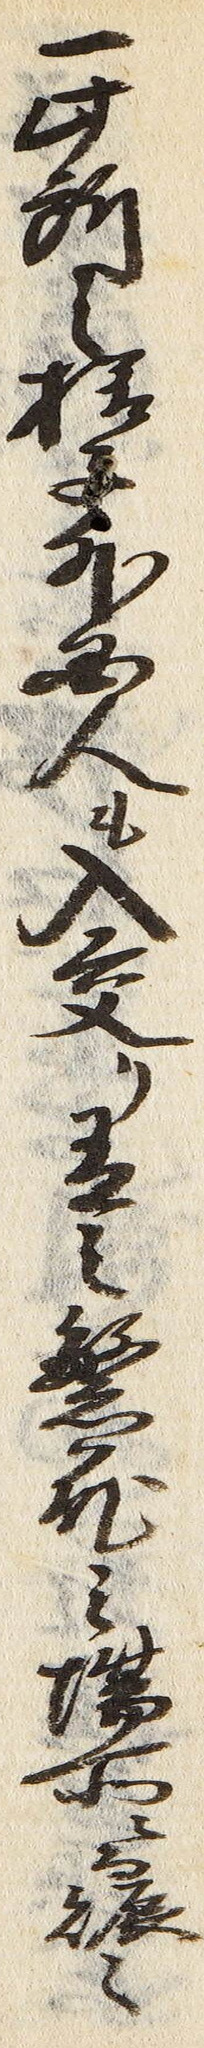一此所之様子外国人も入交り有之繁花之場所ニ而賑々
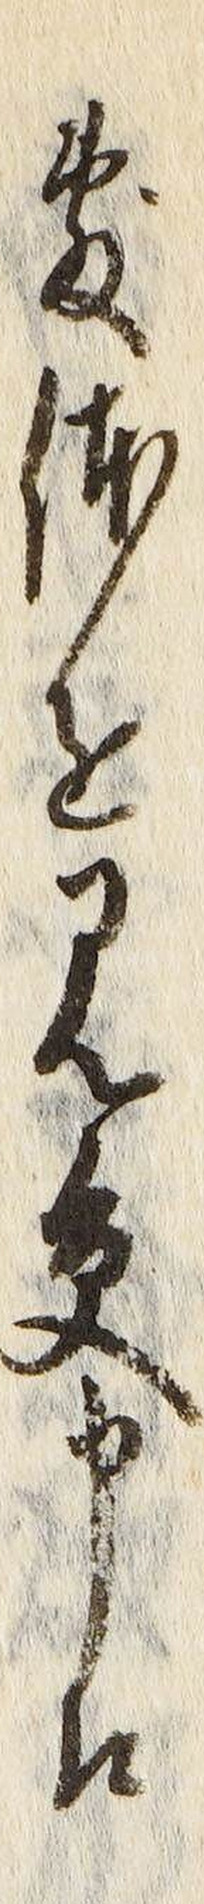敷体を見受申候
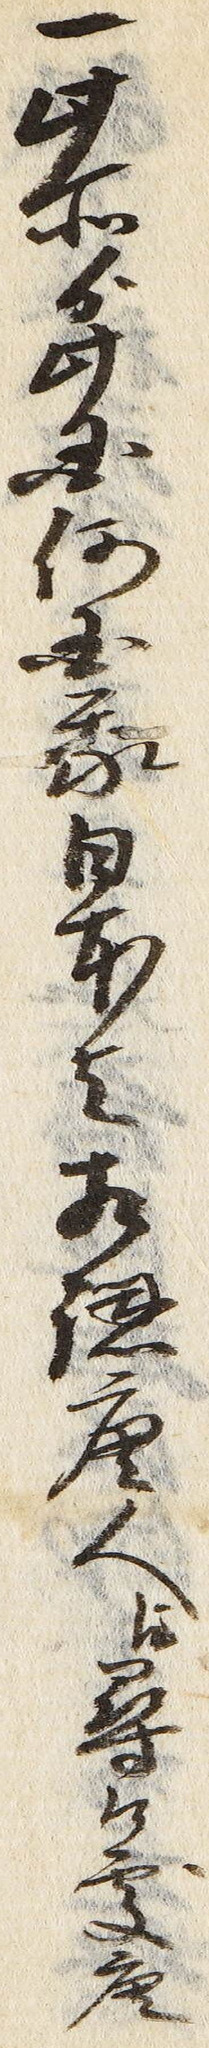一此所ゟ此国何国我日本と相認唐人江尋候處唐
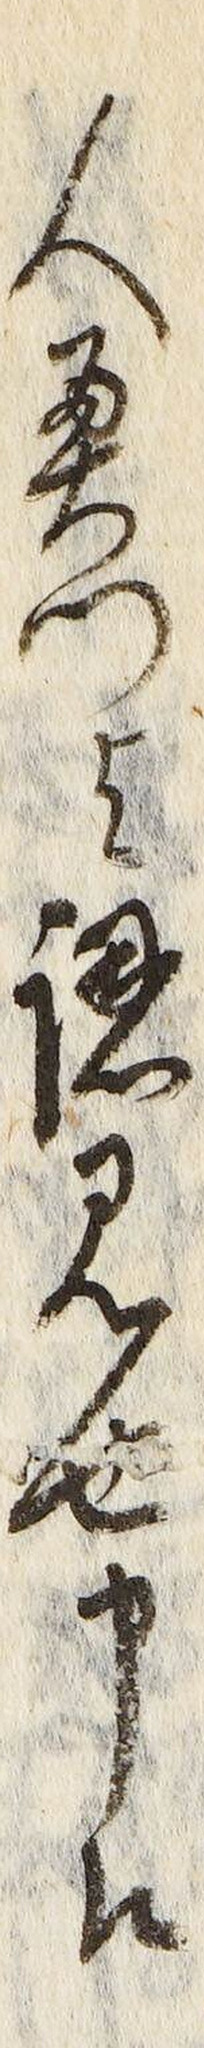人奥門と認見せ申候
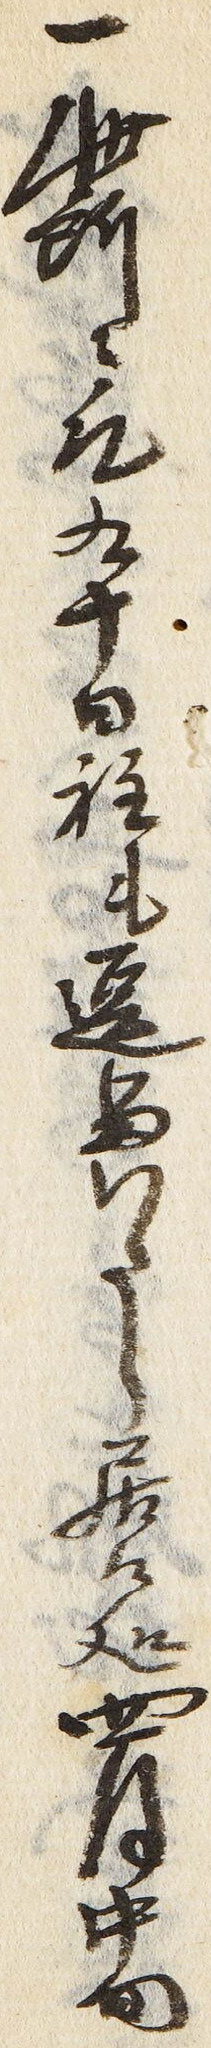一此所ニ凡九十日程も逗留いたし居候処四月中旬
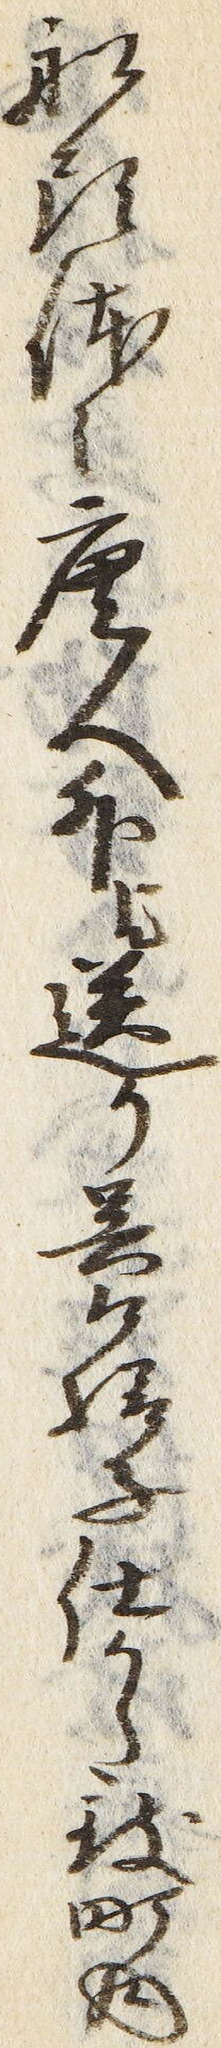舩頭体之唐人外江送り呉候様子仕かた致町内
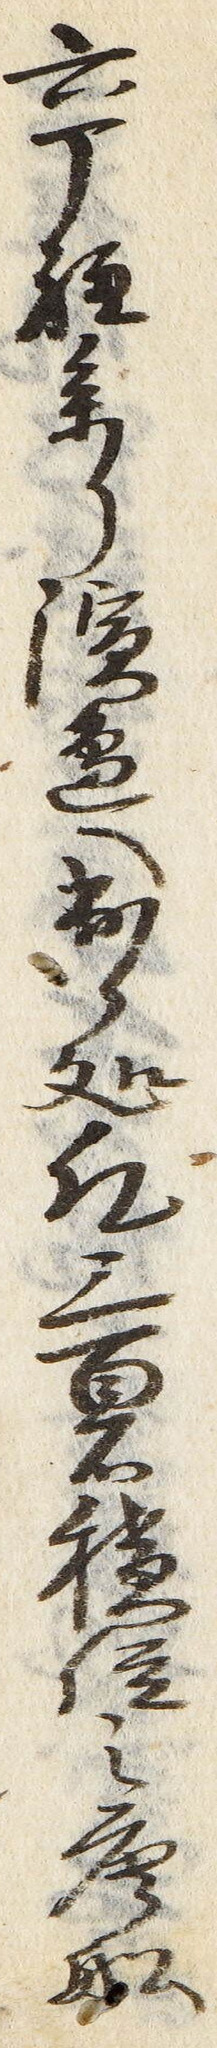六丁程参り濱邊へ出候処凡三百石積位之唐舩

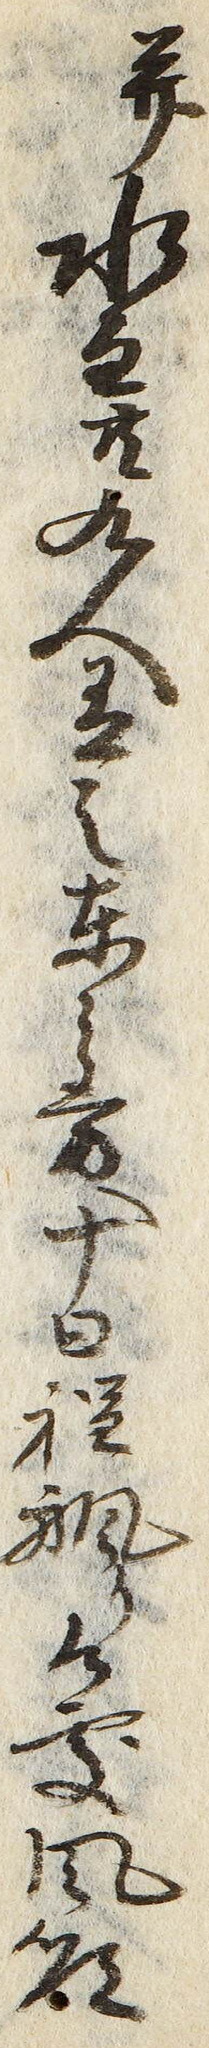幷水主共九人有之東之方へ十日程䑺り候處風順
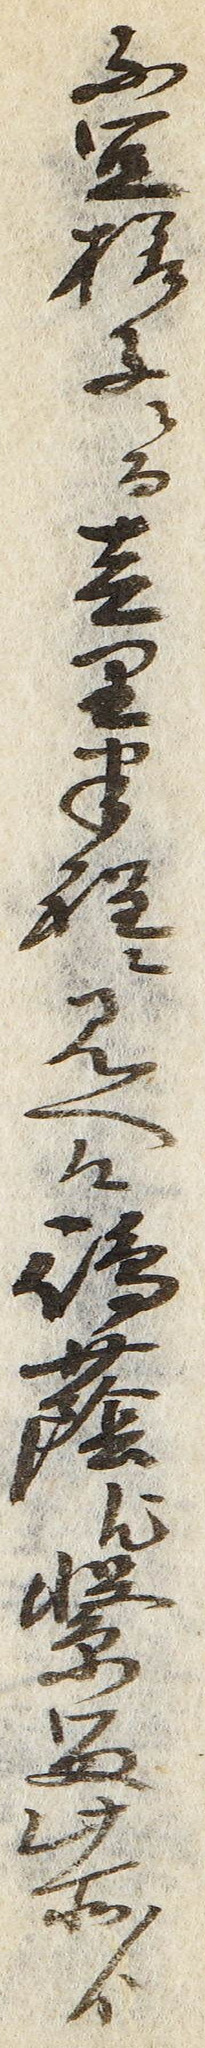不宜様子ニ而壱里半程ニ見へ候嶋蔭江繋留此所ゟ
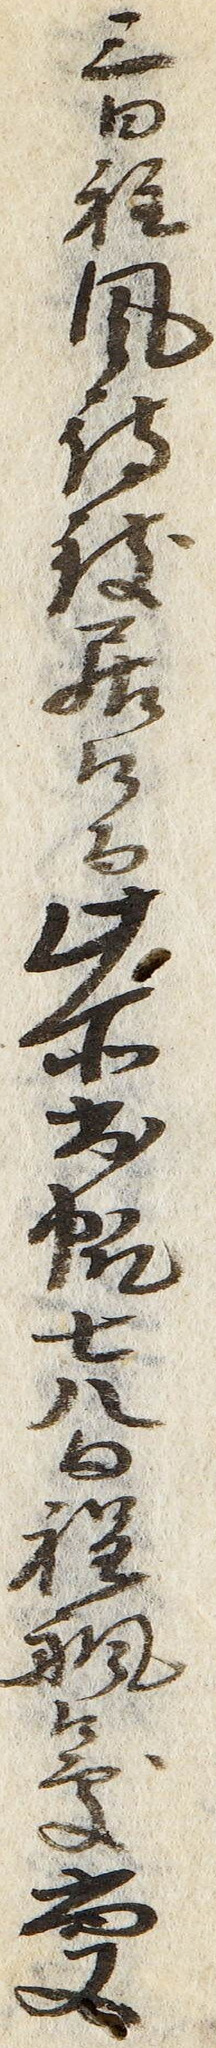三日程風待致居候而此所出帆七八日程䑺候處尚又
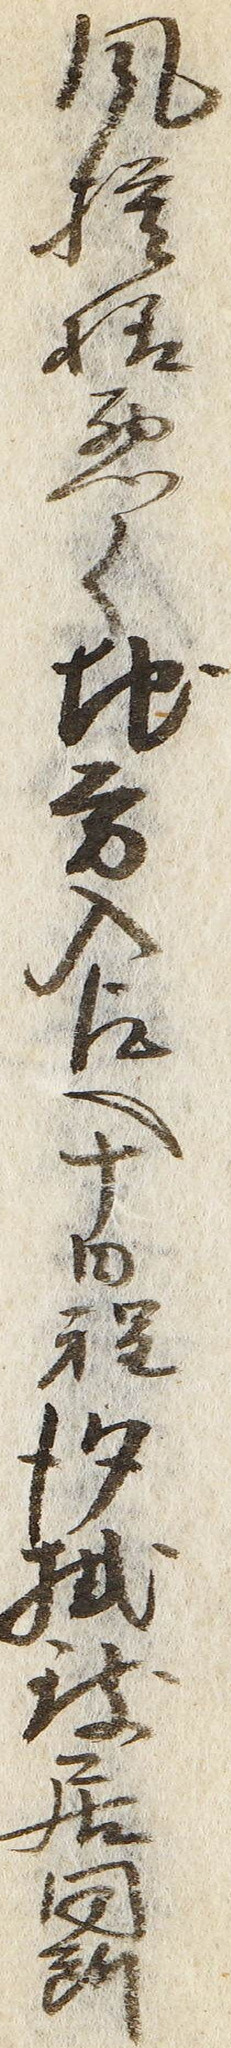風模様悪く地方入江へ十日程汐掛致居同所
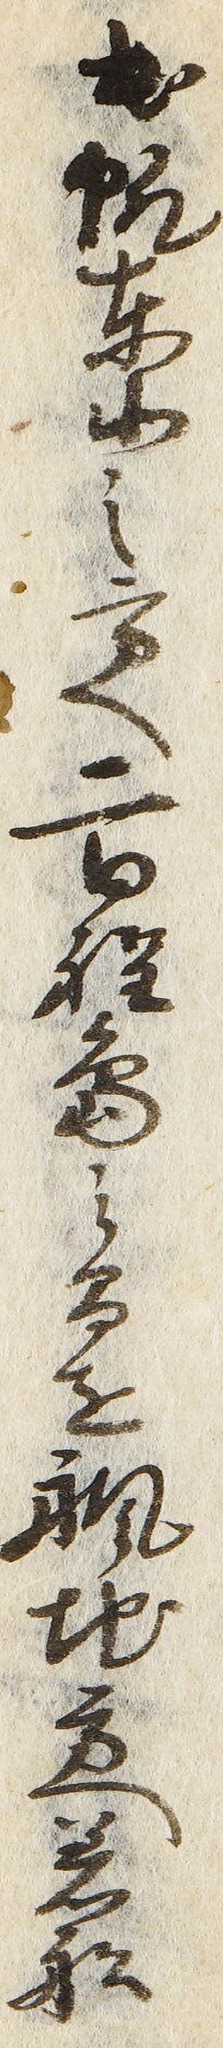出帆東北之方へ二日程島之間を䑺地方へ着舩
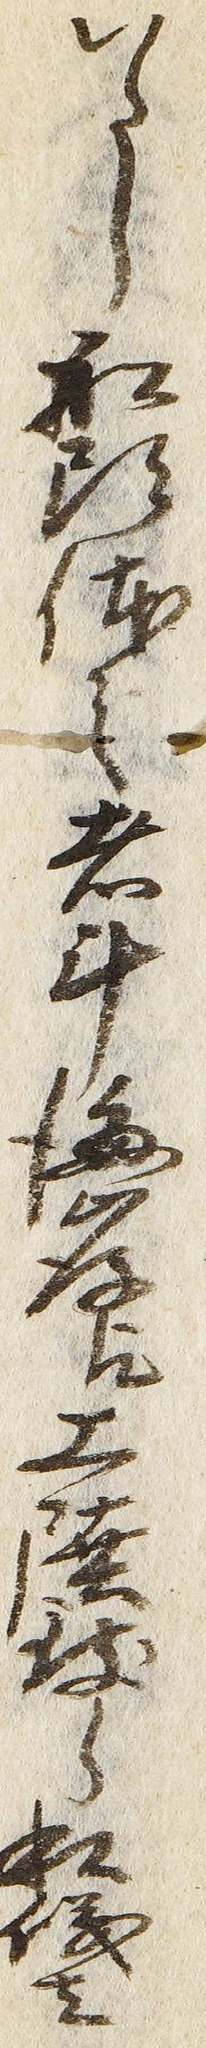いたし舩頭体之者斗海岸江上陸致し私儀者
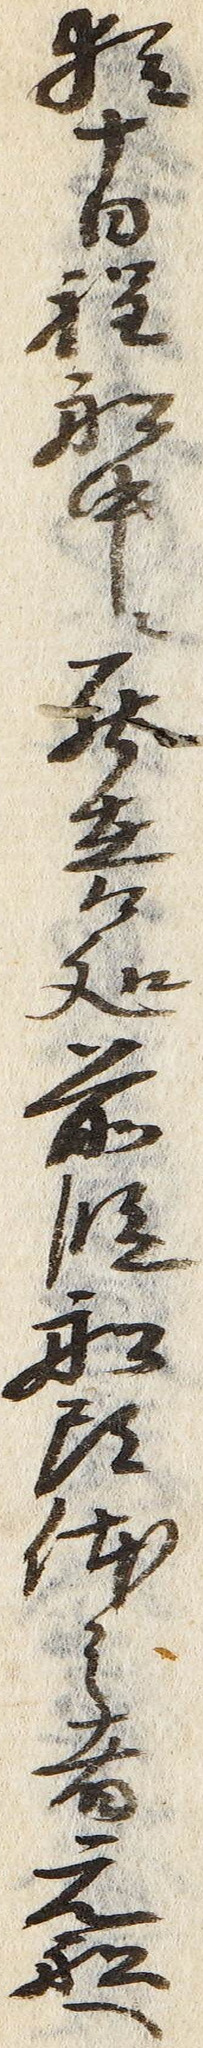猶十日程舩中ニ罷在候処前段舩頭体之者元舩へ
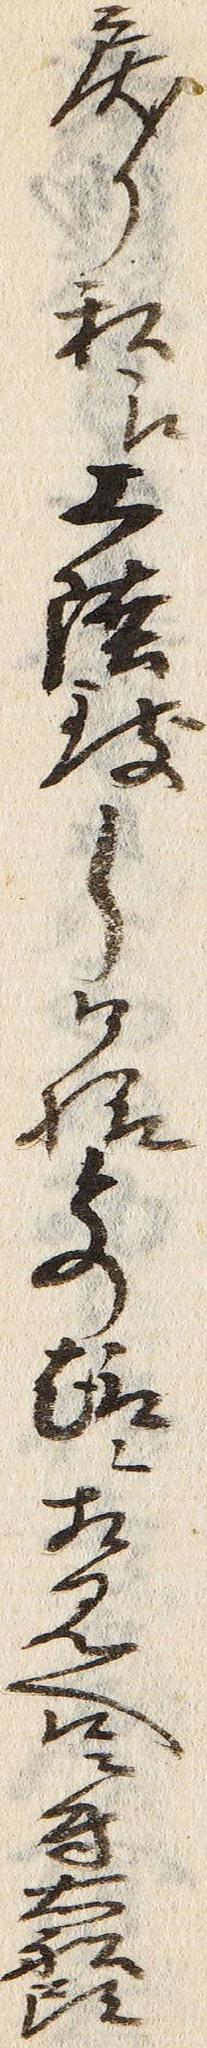戻り私江上陸致し候様との趣ニ相見へ候ニ付右舩頭
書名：漂流人善助聞書
